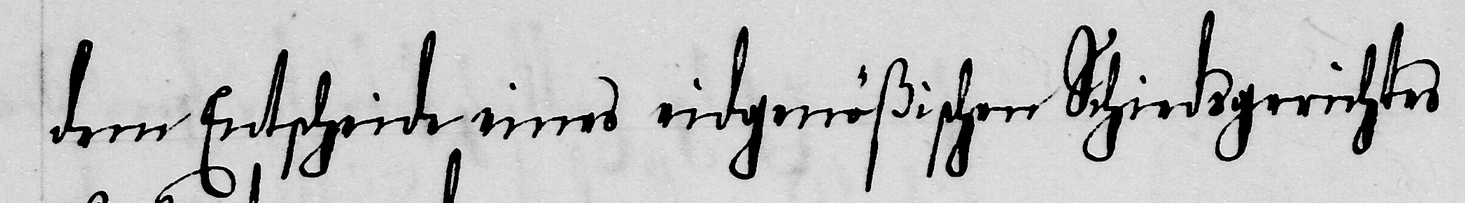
dem Entscheide eines eidgenößischen Schiedsgerichtes
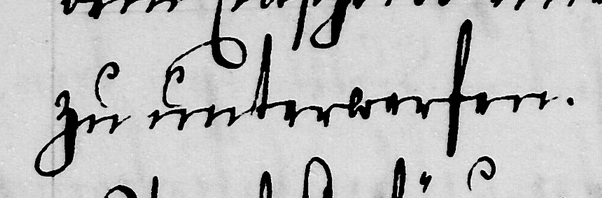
zu unterwerfen.
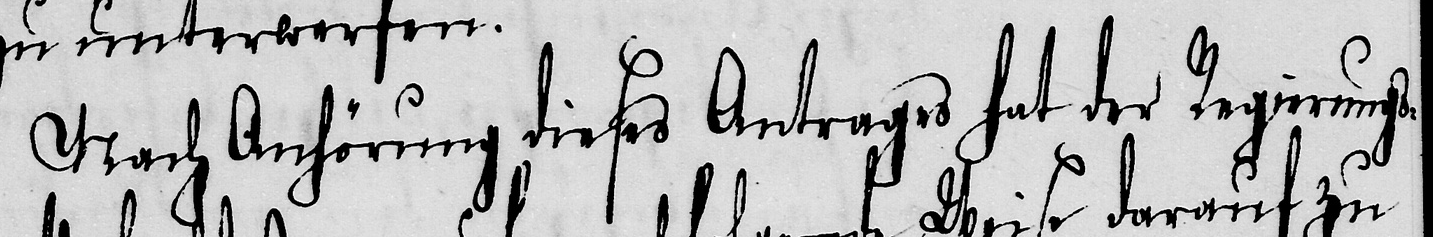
Nach Anhörung dieses Antrages hat der Regierung¬
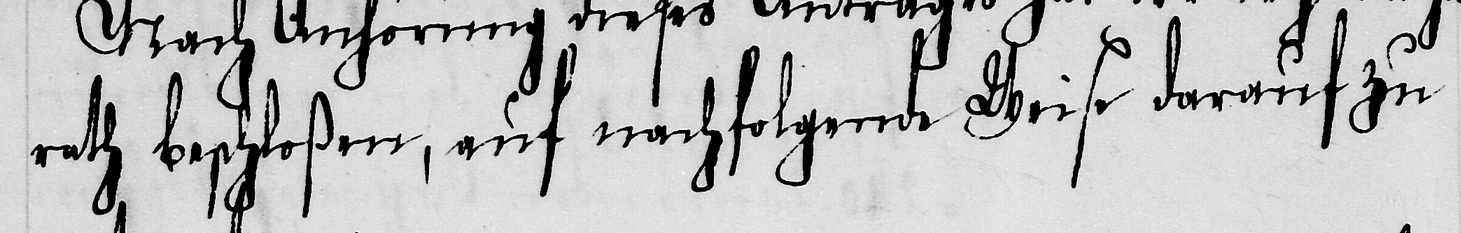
rath beschloßen, auf nachfolgende Weise darauf zu
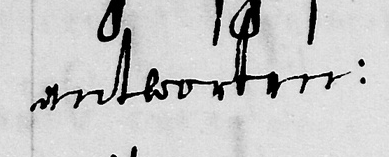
antworten:
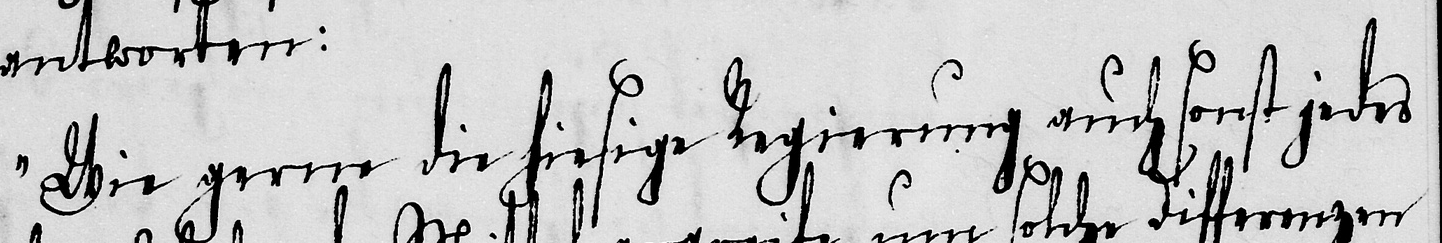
„Wie gerne die hiesige Regierung auch sonst jedes
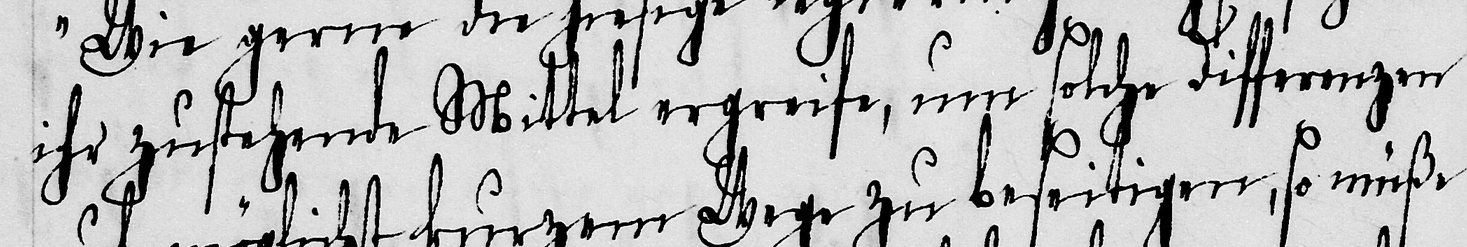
ihr zustehende Mittel ergreife, um solche Differenzen
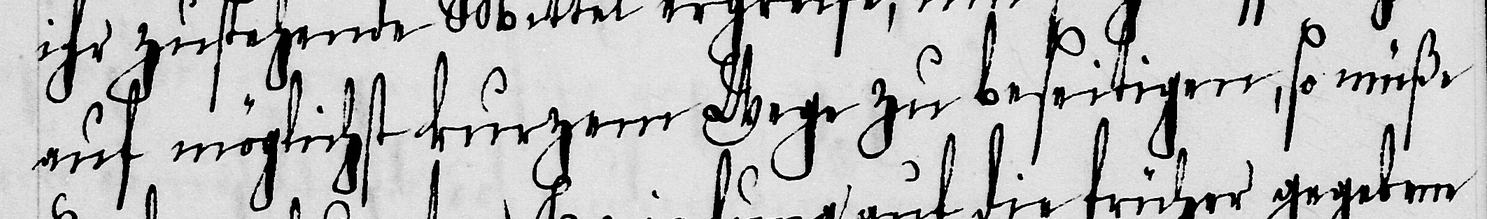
auf möglichst kurzem Wege zu beseitigen, so müße
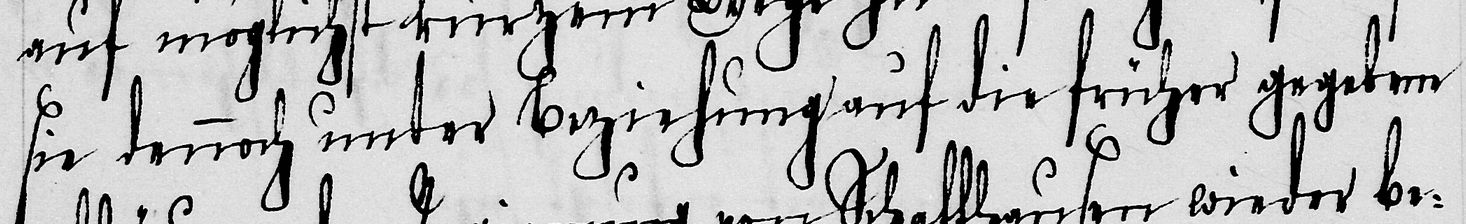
sie dennoch unter Beziehung auf die früher gegebene
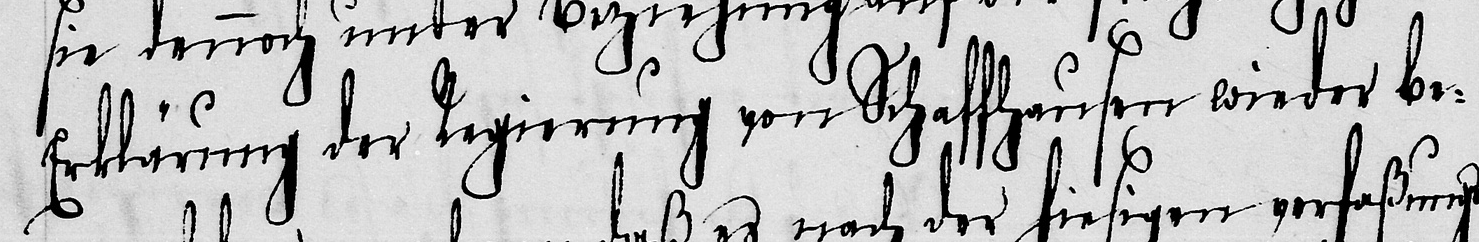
Erklärung der Regierung von Schaffhausen wieder be¬
